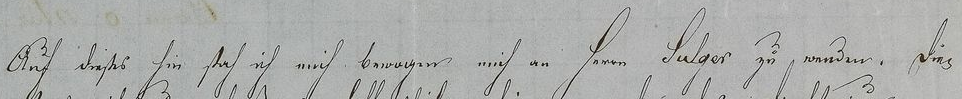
Auf dieses hin sah ich mich bewogen mich an Herrn Sulger zu wenden. Die-
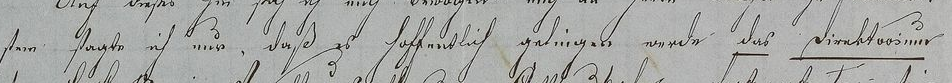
sem sagte ich nur, daß es hoffentlich gelingen werde dasDirektorium
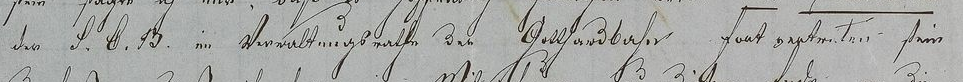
der S.C.B. im Verwaltungsrathe der Gotthardbahn fort vertreten sein
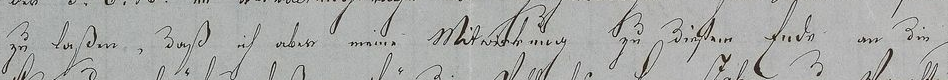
zu laßen, daß ich aber meine Mitwirkung zu diesem Ende an die
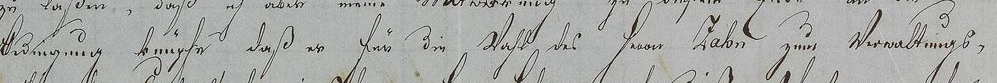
Bedingung knüpfe daß er für die Wahl des Herrn Zahn zum Verwaltungs-
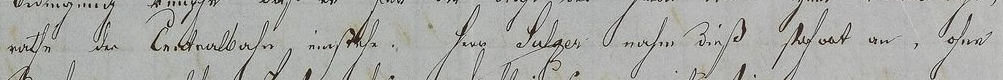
rathe der Centralbahn einstehe. Herr Sulger nahm dieß sofort an, ohne
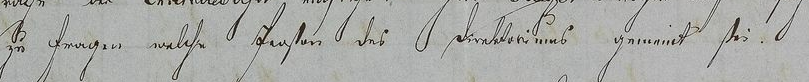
zu fragen welche Person des Direktoriums gemeint sei.
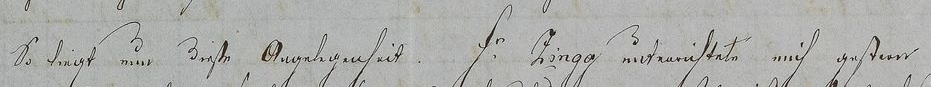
So liegt nun diese Angelegenheit. HrZingg unterrichtete mich gestern
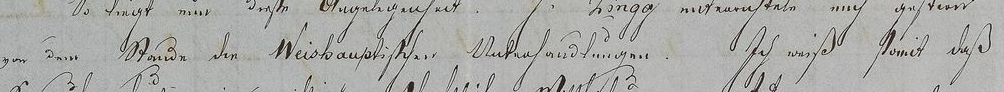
von dem Stande der Weishauptischen Unterhandlungen. Ich weiß somit daß
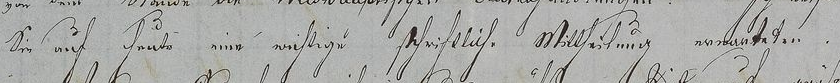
Sie auf heute eine wichtige schriftliche Mittheilung erwarteten.
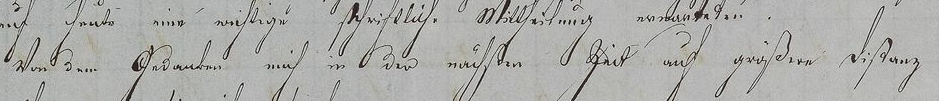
Von dem Gedanken mich in der nächsten Zeit auf größere Distanz
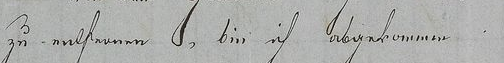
zu entfernen, bin ich abgekommen.
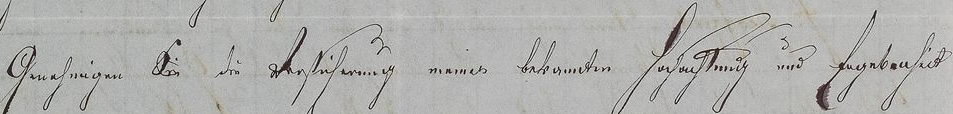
Genehmigen Sie die Versicherung meiner bekannten Hochachtung und Ergebenheit
